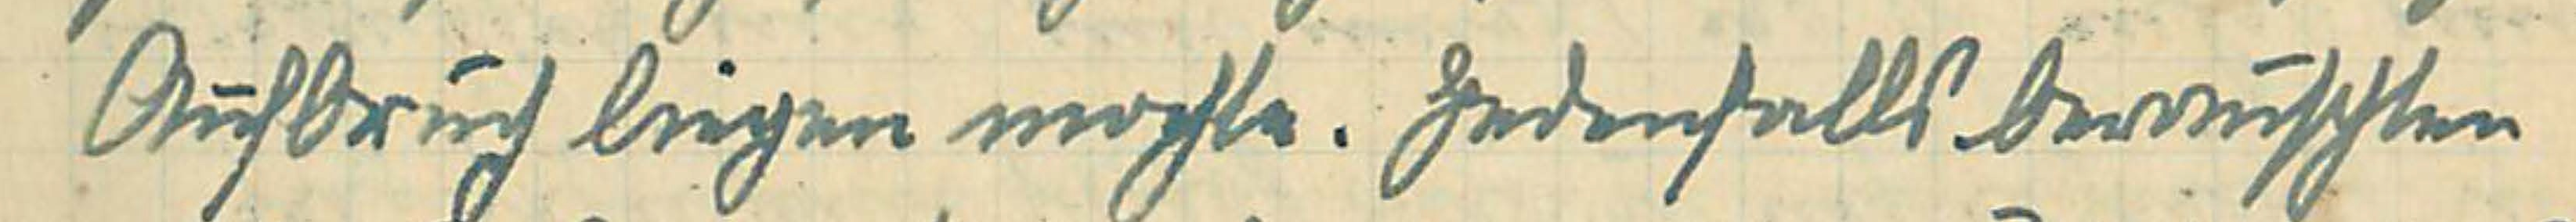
Aufbruch liegen mochte. Jedenfalls berauschten
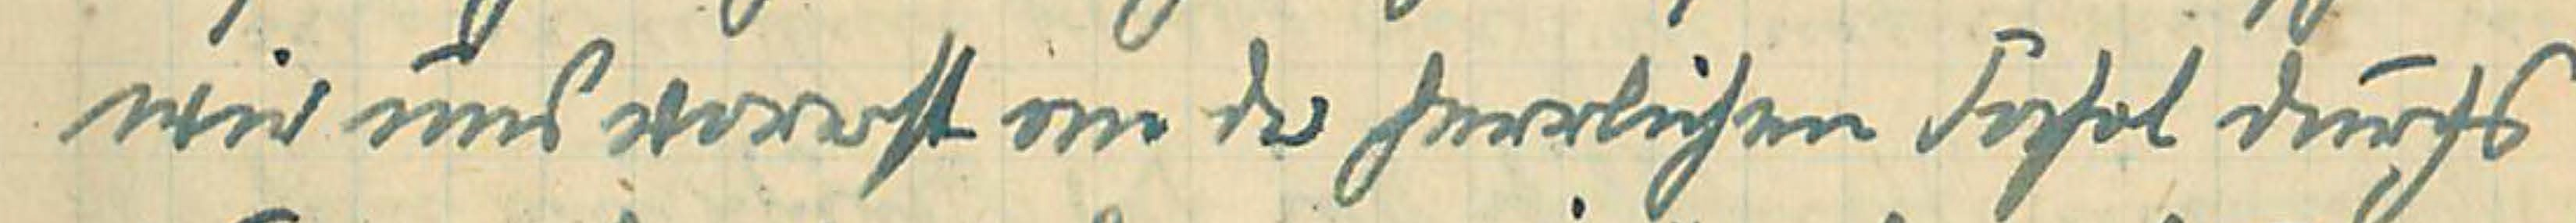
wir uns vorerst an der herrlichen Fahrt durchs
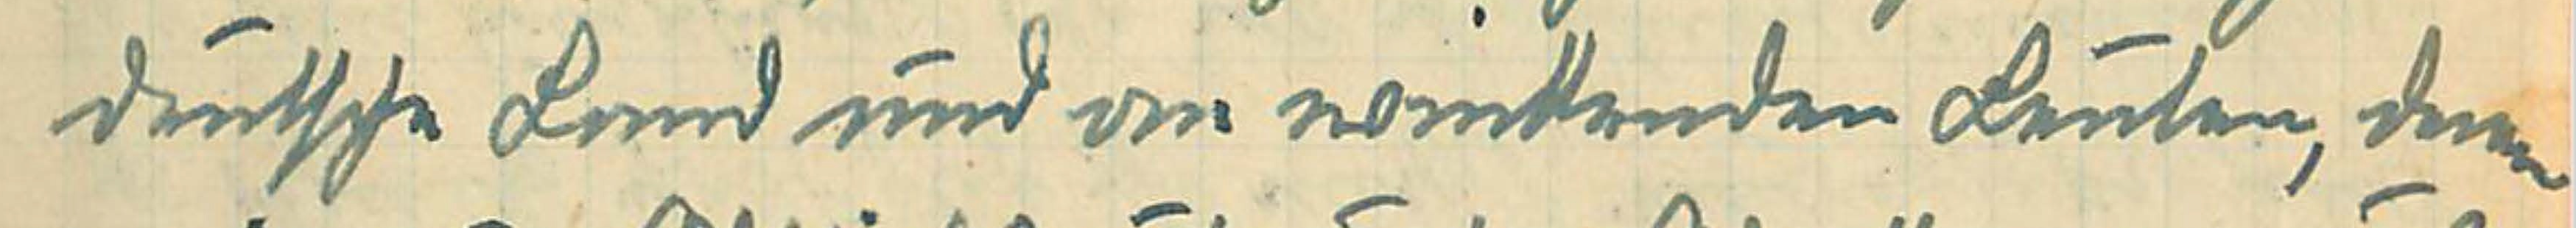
deutsche Land und an winkenden Leuten, denen
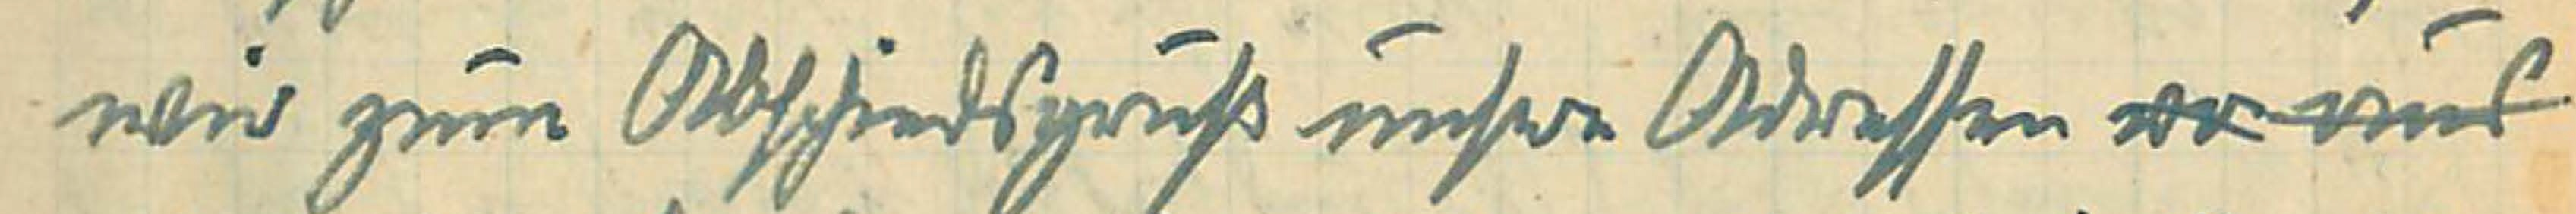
wir zum Abschiedsgruß unsere Adressen vo aus
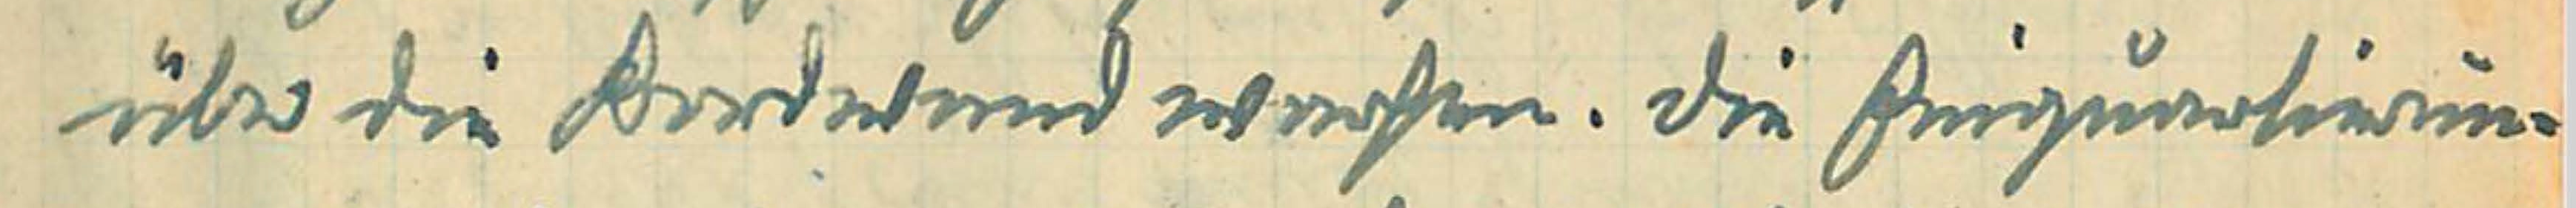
über die Bordwand warfen. Die Einquartierun-
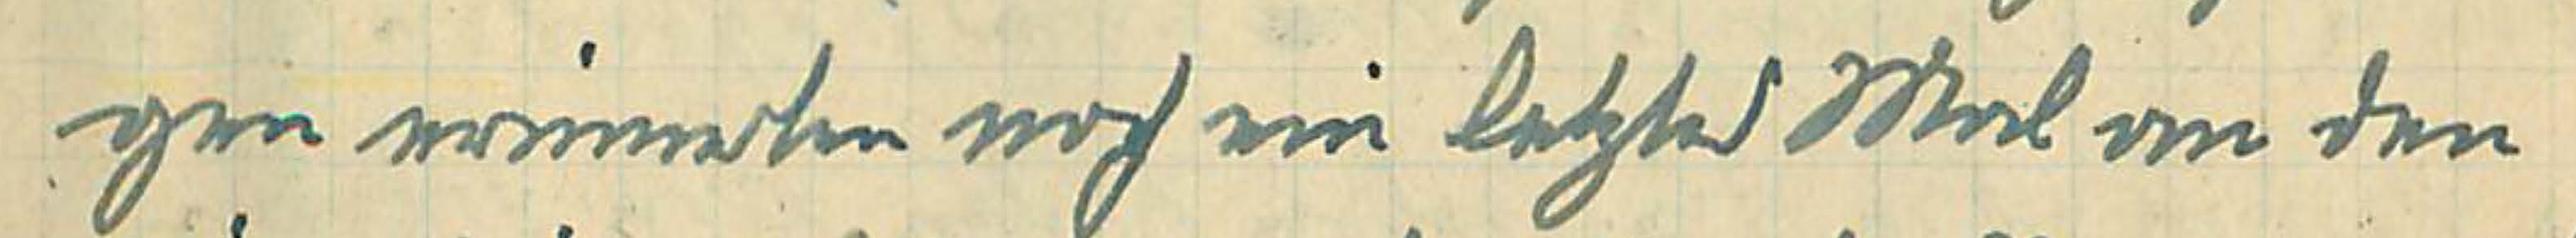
gen erinnerten noch ein letztes Mal an den
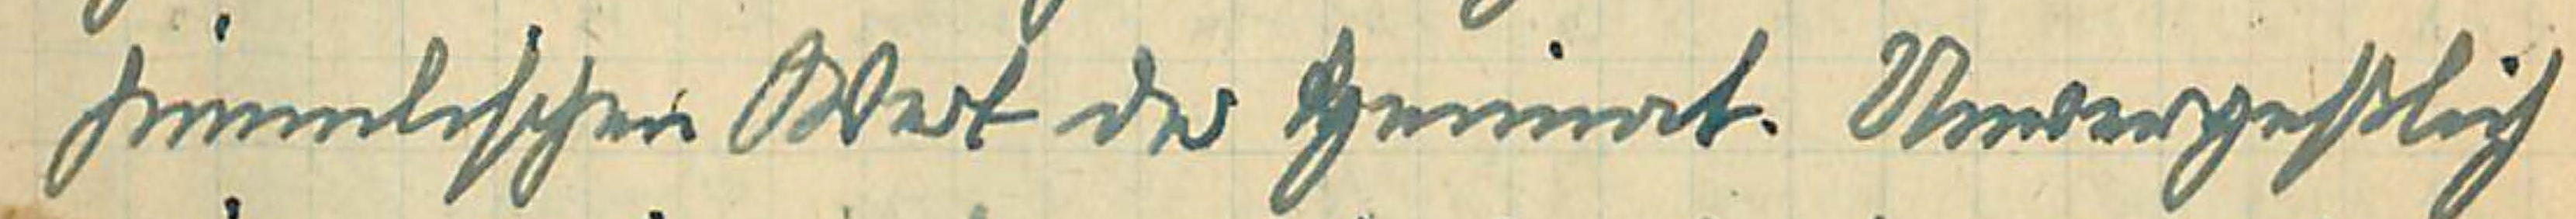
himmlischen Wert der Heimat. Unvergeßlich
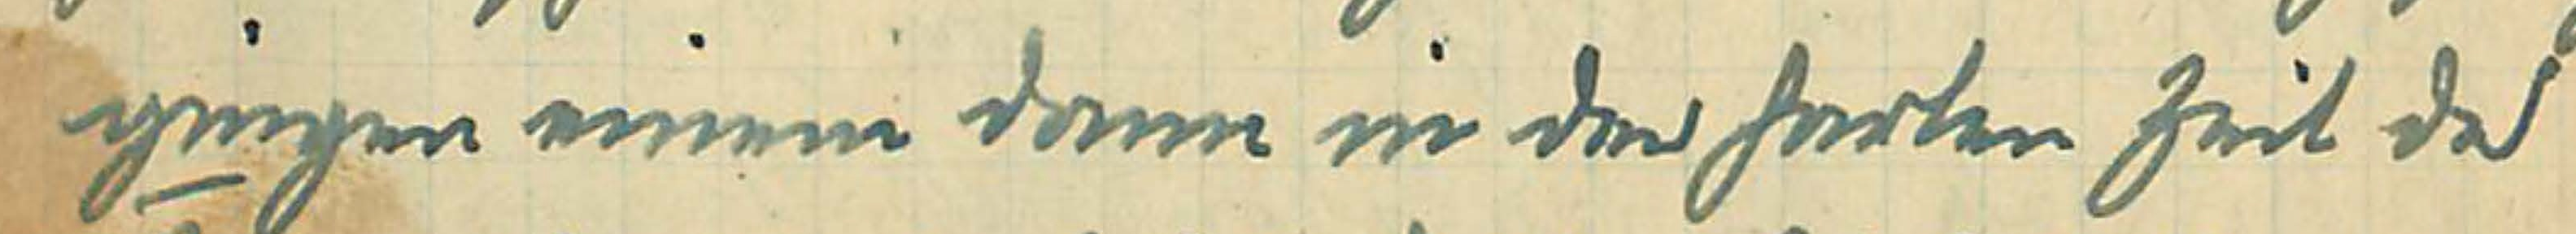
gingen einem dann in der harten Zeit des
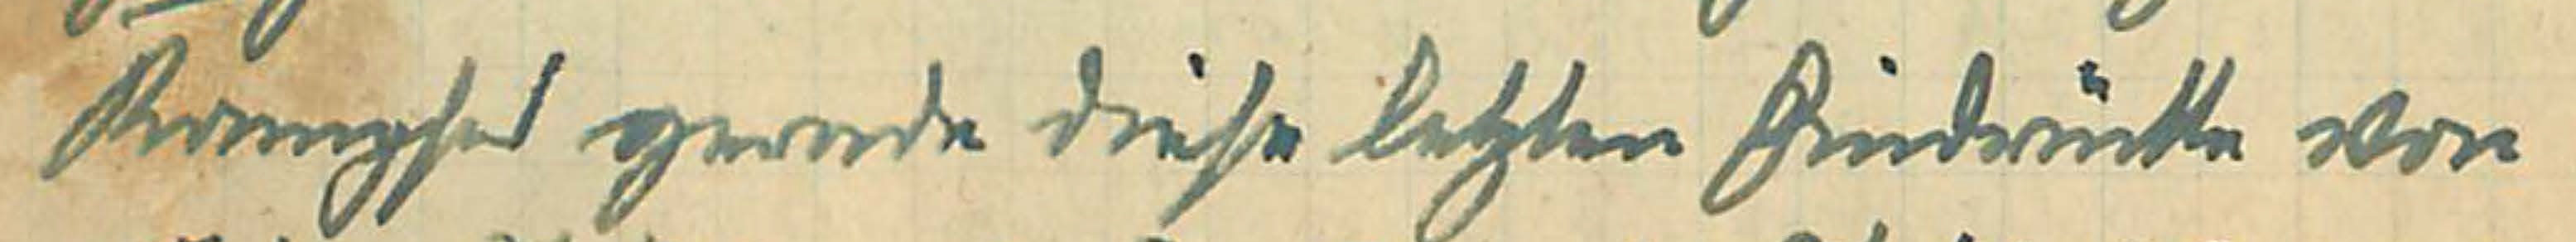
Kampfes gerade diese letzten Eindrücke von
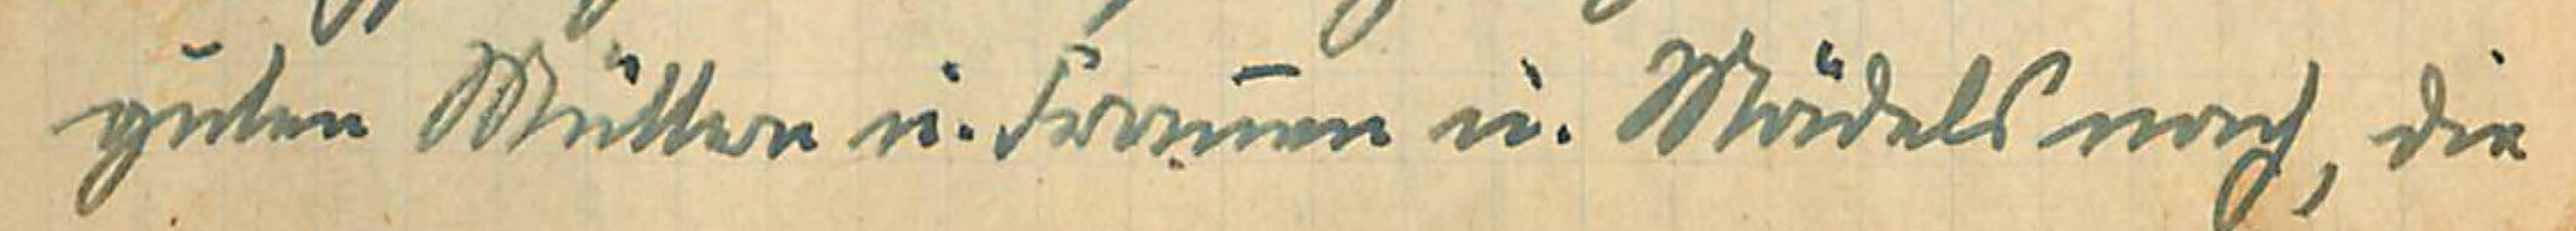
guten Müttern u. Frauen u. Mädels nach, die
